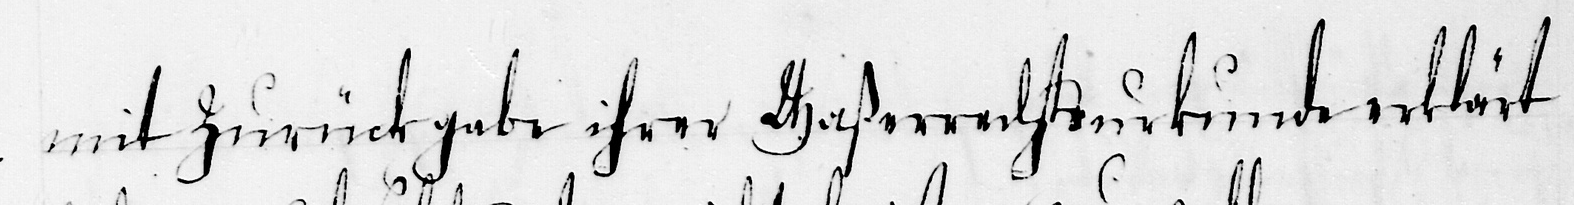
mit Zurückgabe ihrer Waßerrechtsurkunde erklärt
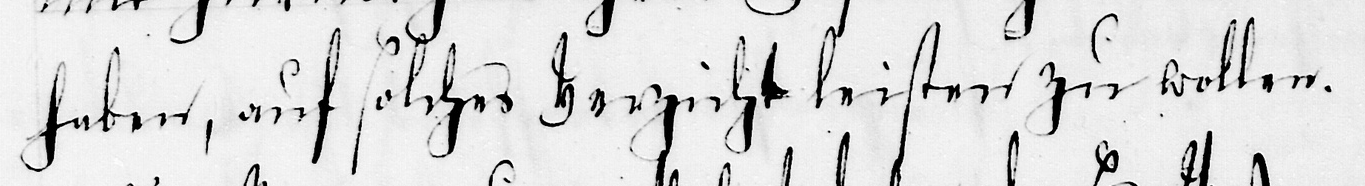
haben, auf solches Verzicht leisten zu wollen.
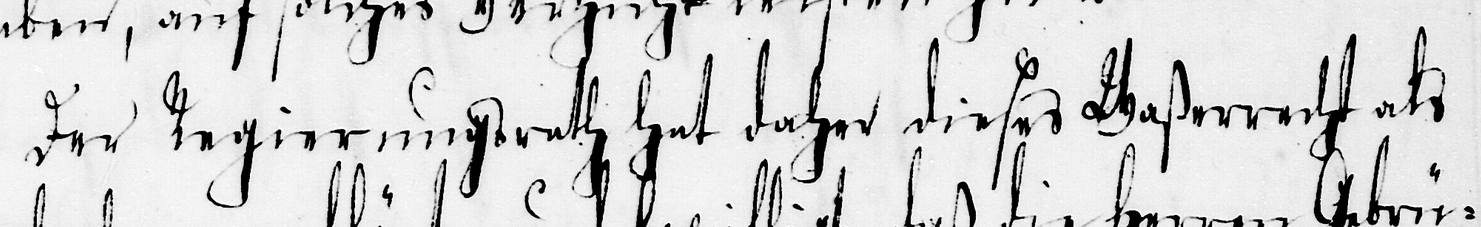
Der Regierungsrath hat daher dieses Waßerrecht als
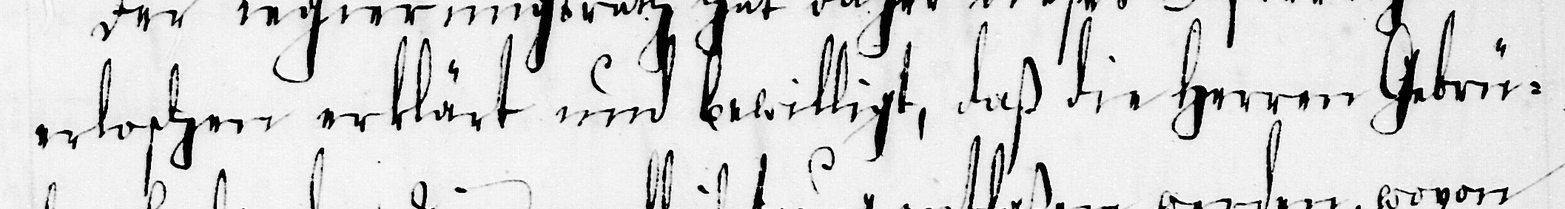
erloschen erklärt und bewilligt, daß die Herren Gebrü¬
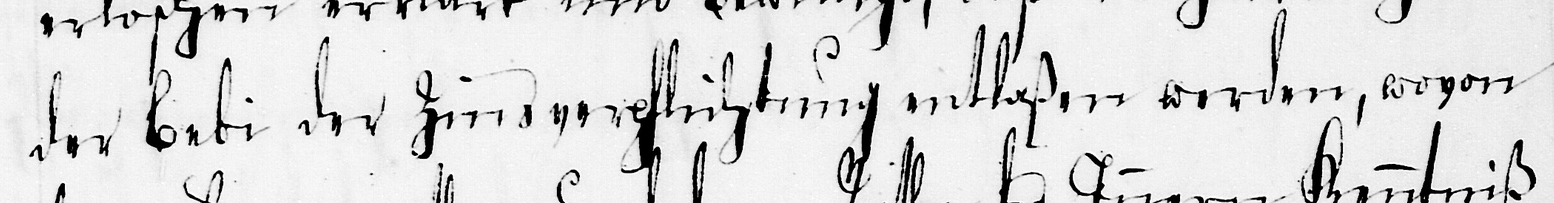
der Bebi der Zinsverpflichtung entlaßen werden, wovon
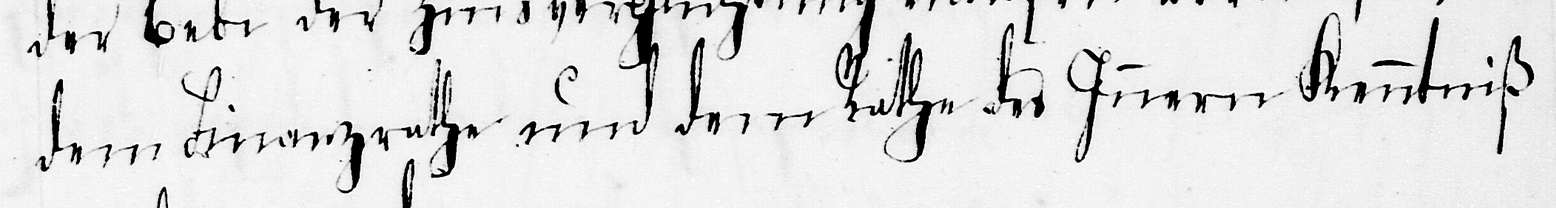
dem Finanzrathe und dem Rathe des Innern Kenntniß
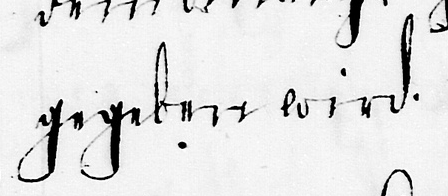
gegeben wird.
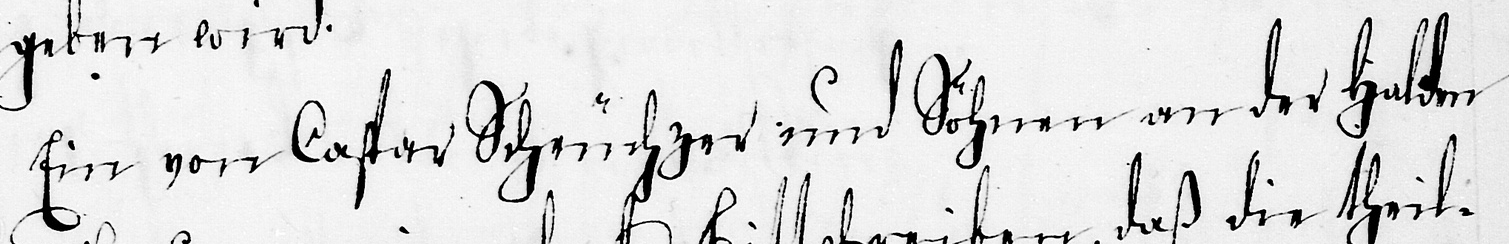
Ein von Caspar Scheuchzer und Söhnen an der Halden
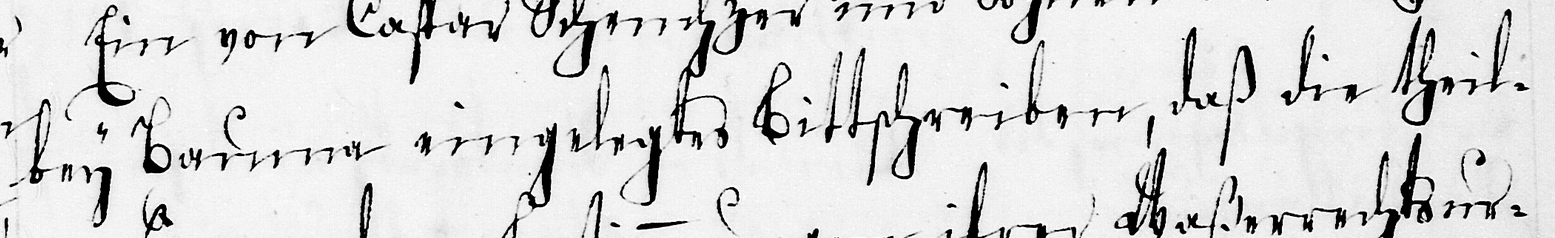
bey Bauma eingelegtes Bittschreiben, daß die theil¬
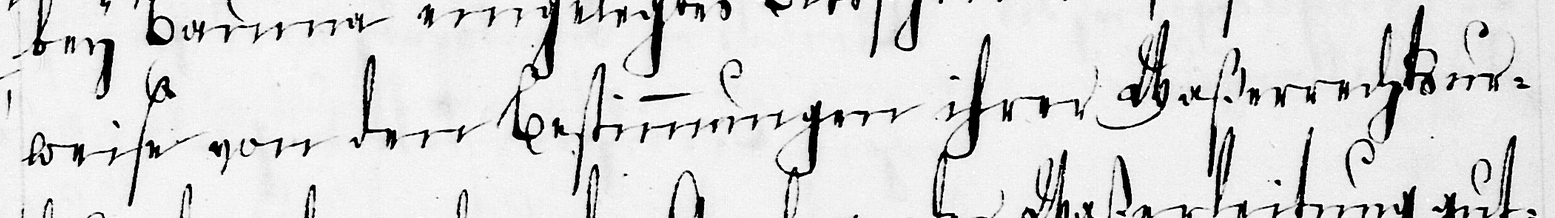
weise von den Bestimmungen ihrer Waßerrechtsur¬
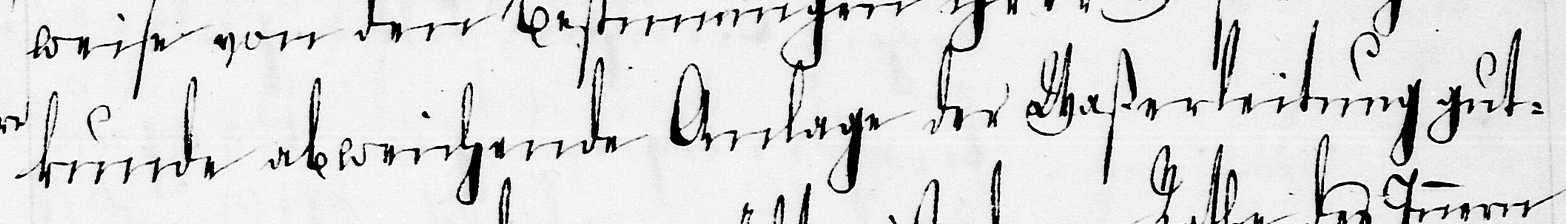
kunde abweichende Anlage der Waßerleitung gut¬
